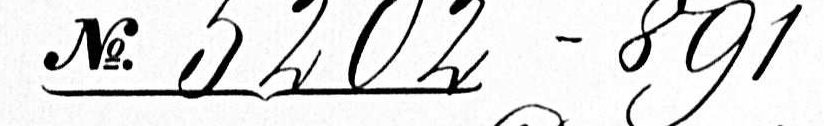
No 5202 – 891
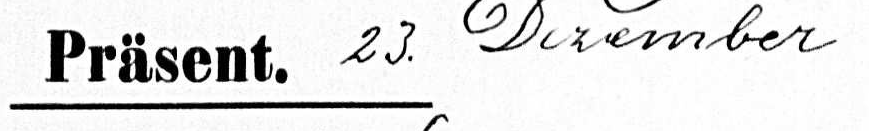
Präsent. – 23. December
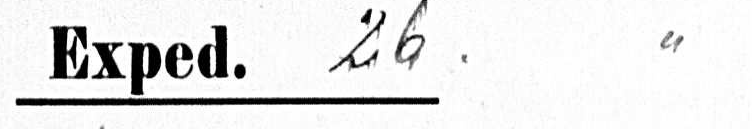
Exped. – 26. „
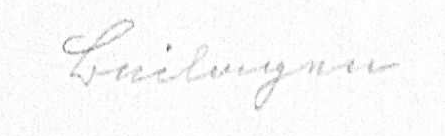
Beilagen
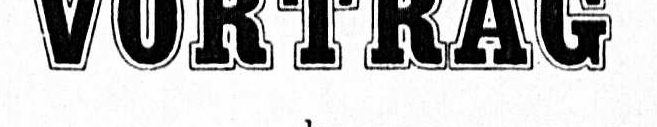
VORTRAG
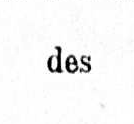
des
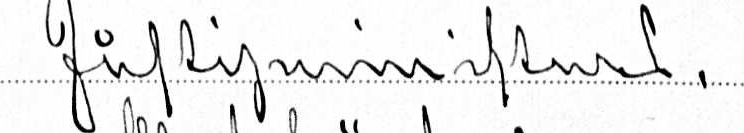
Justizministers,
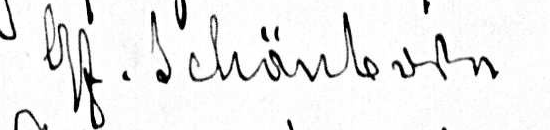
Gf. Schönborn
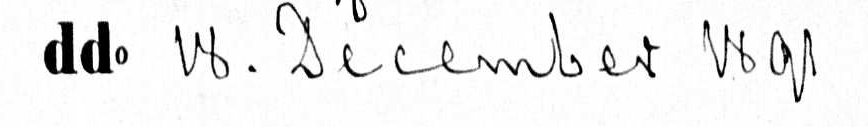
ddo 18. December 1891
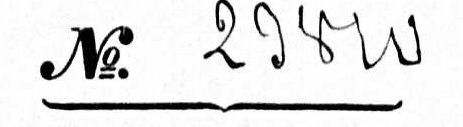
No. 23810
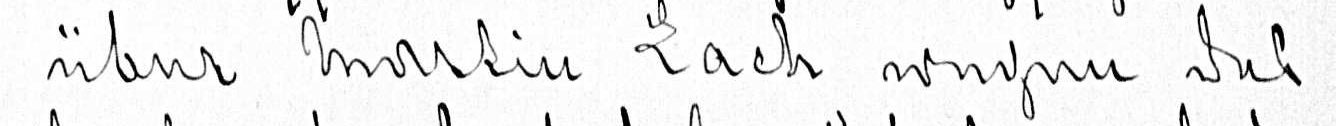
über Martin Lach wegen des
